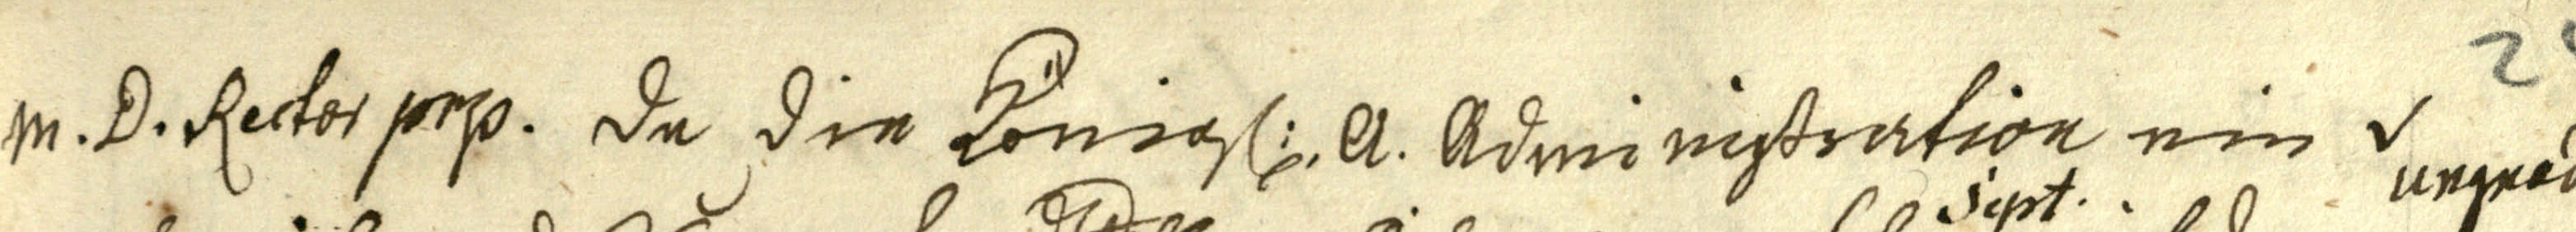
M. D. Rector prp. Da die Königl. A. Administration ein
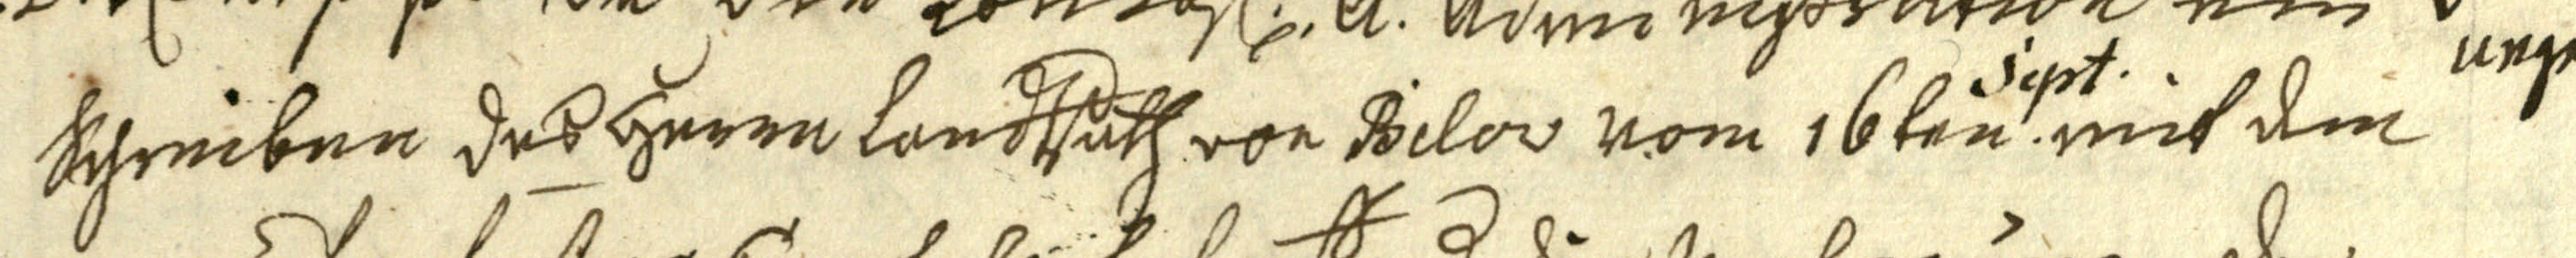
Schreiben des Herrn LandRath von Bilow vom b16ten Sept. dem
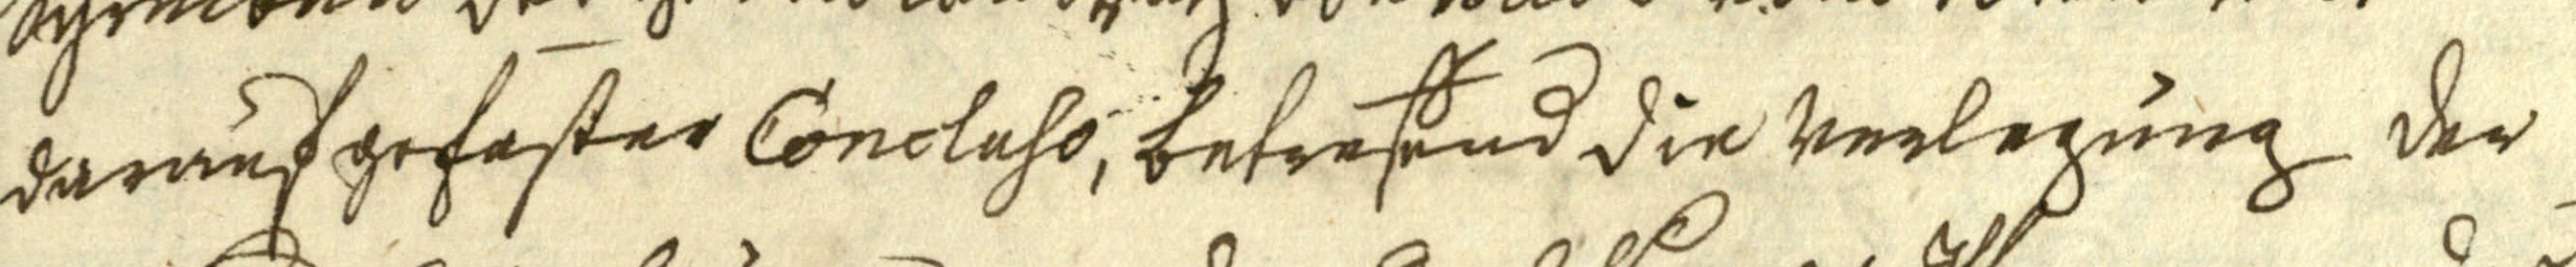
darauf gefasten Conclusi, betreffend die Verlegung der
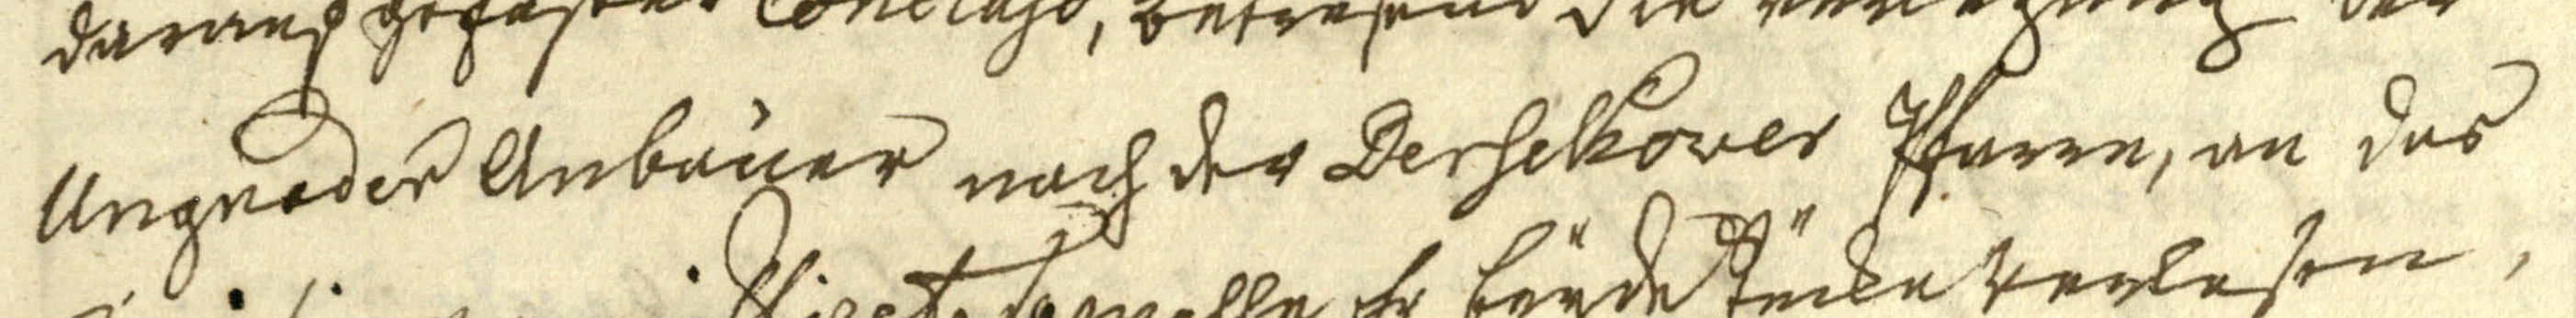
Ungnader Anbauer nach der Dersekower Pfarre, an das
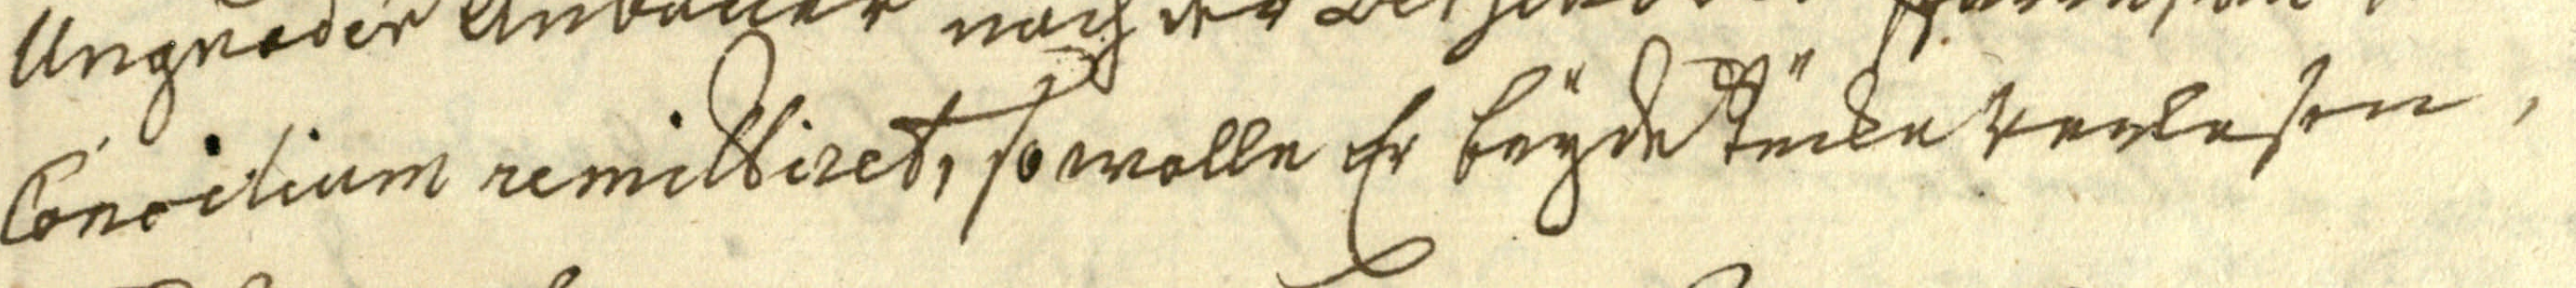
Concilium remittiret, so wolle Er beÿde Stücke verlesen,
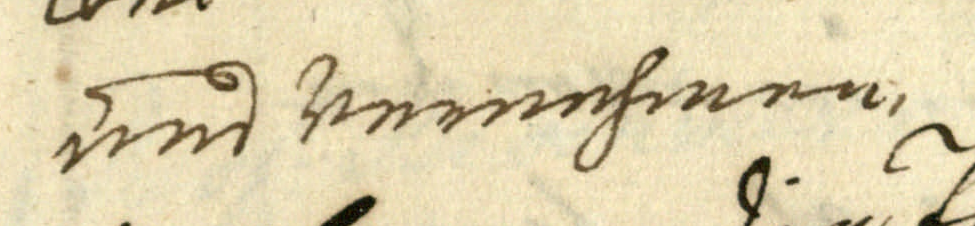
die vernehmen,
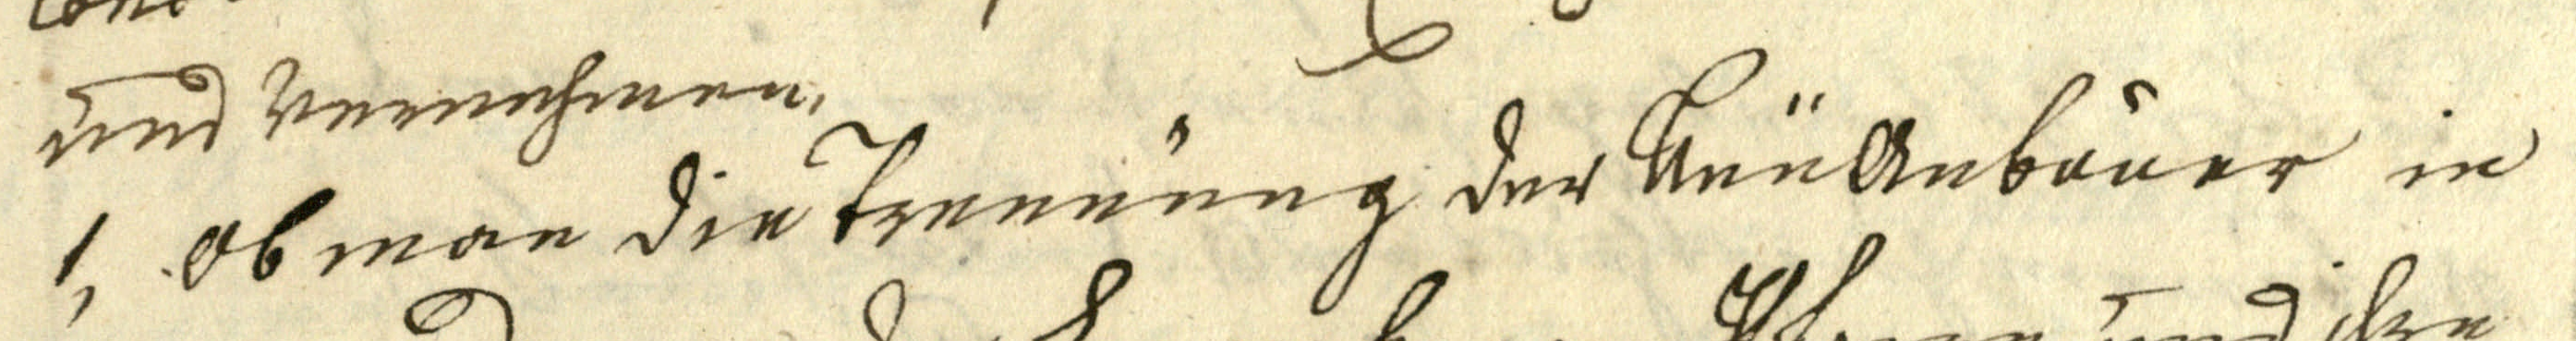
1, Ob man die Trennung der Neu Anbauer in
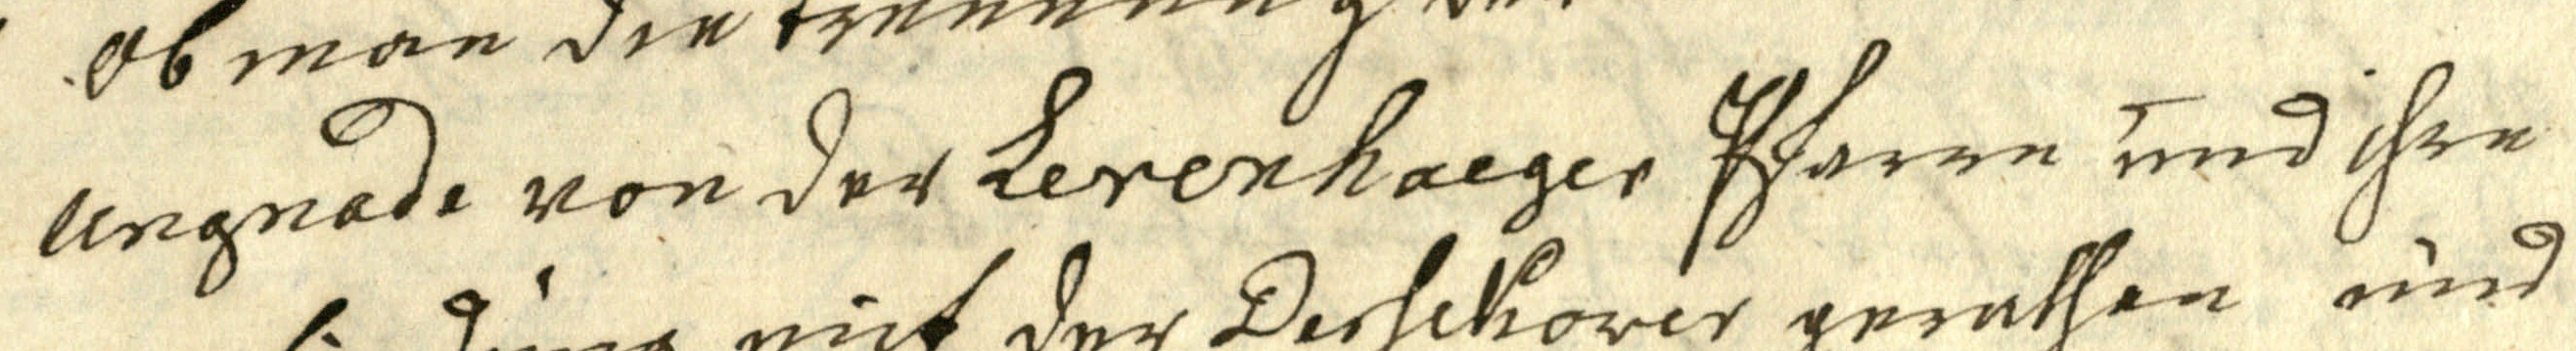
Ungnade von der Levenhaeger Pfarre und ihre
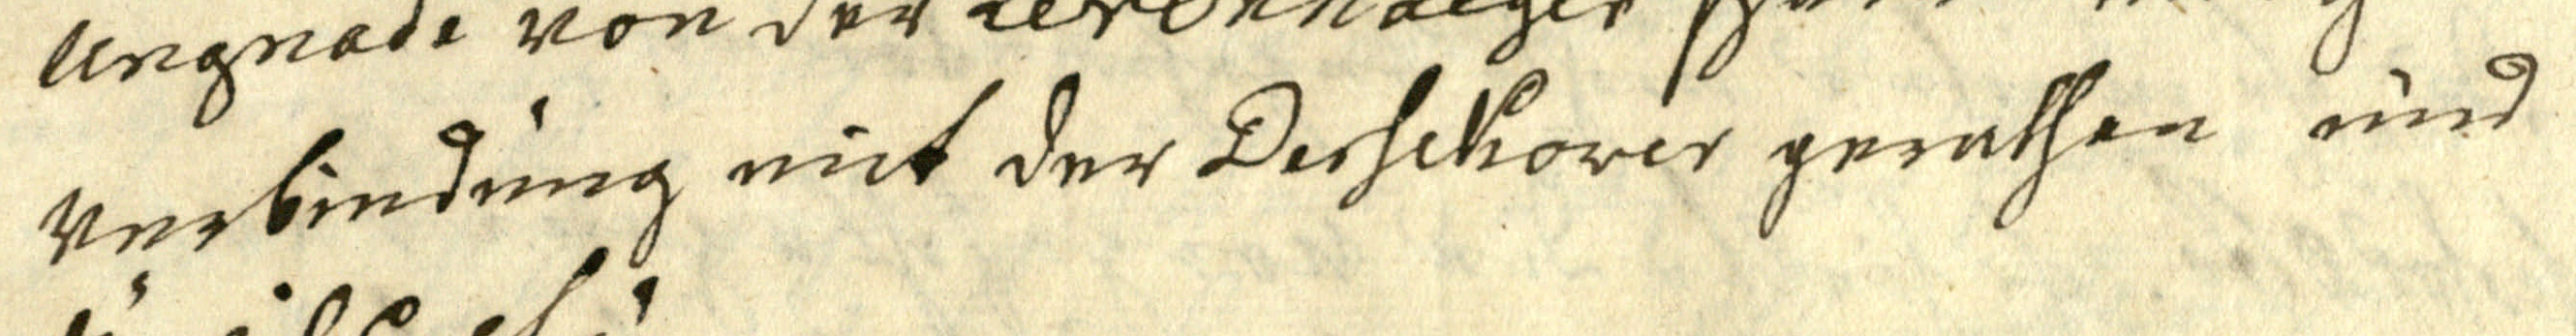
Verbindung mit der Dersekower gerathen und
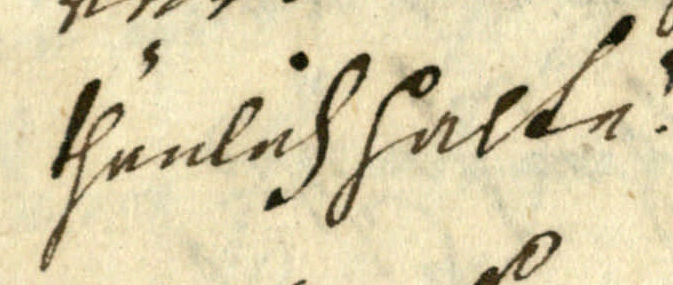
thunlich halte?
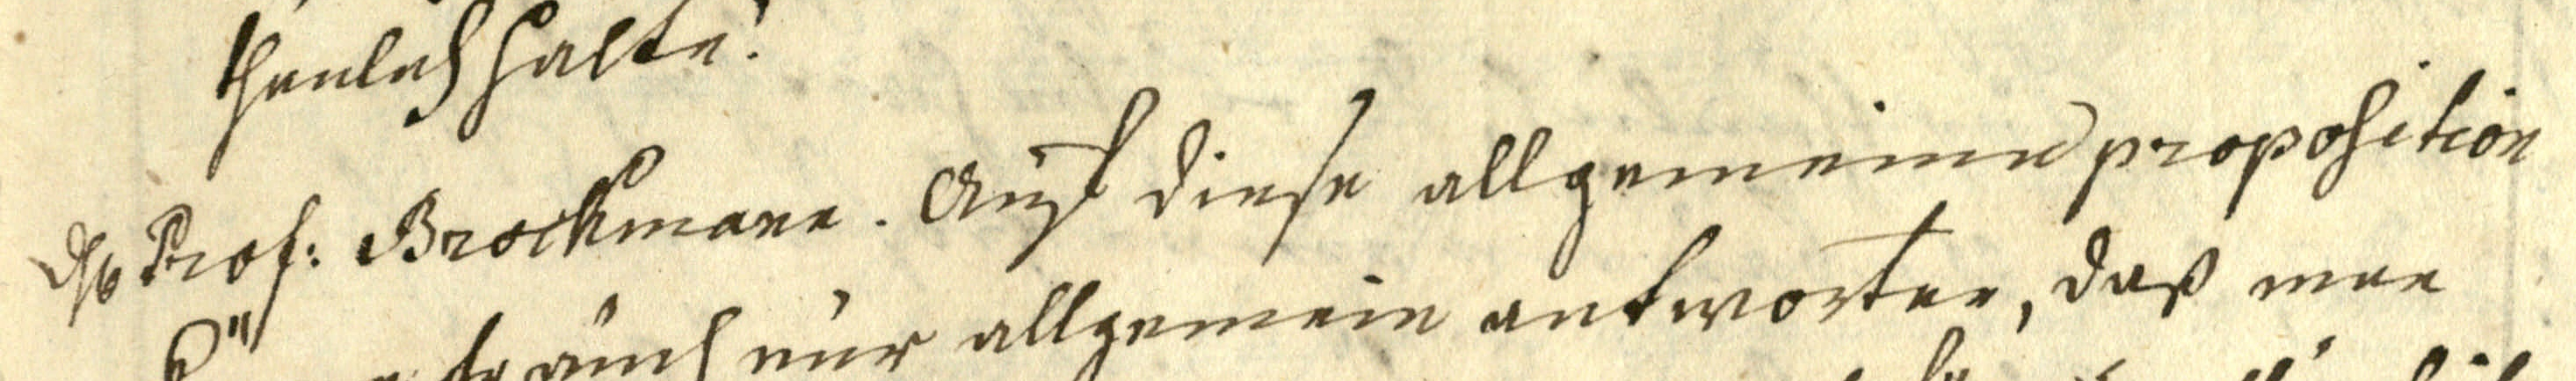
dh Prof. Brockmann. Auf diese allgemeine proposition
